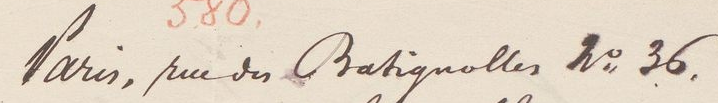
Paris, rue des Batignolles No 36.
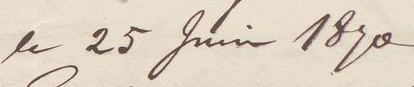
le 25 Juin 1870
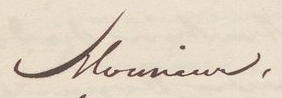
Monsieur,
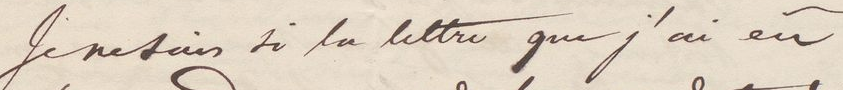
Je ne sais si la lettre que j'ai eû
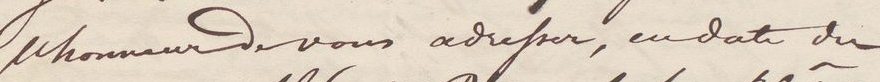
l'honneur de vous adresser, en date du
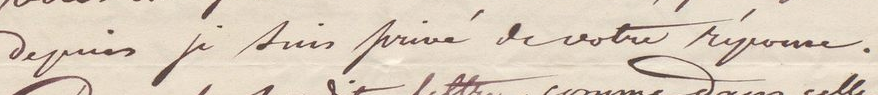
depuis je suis privé de votre réponse.
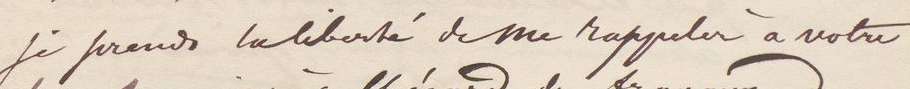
je prends la liberté de me rappeler à votre
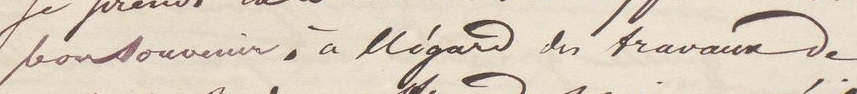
bon souvenir, à l'égard des travaux de
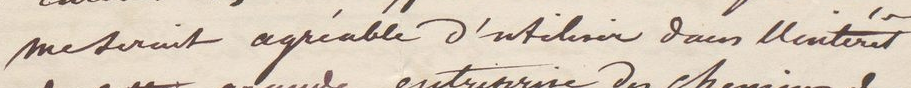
me serait agréable d'utiliser dans l'intérêt
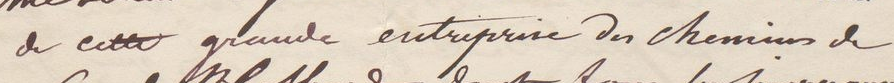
de cette grande entreprise des chemins de
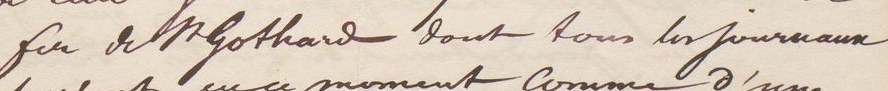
fer de St Gothard dont tous les journaux
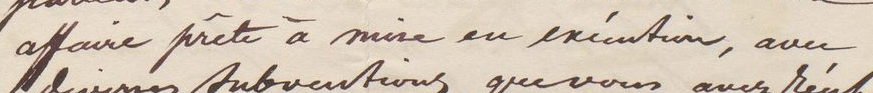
affaire prête à mise en exécution, avec
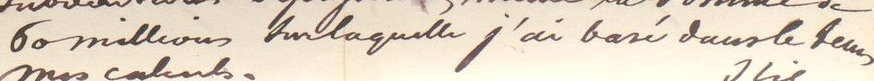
60 millions sur la quelle j'ai basé dans le tems
